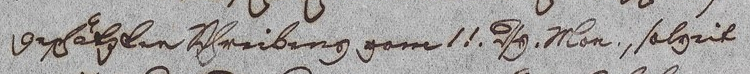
geschätzten Schreibens vom 11. dss. Mon. , soweit
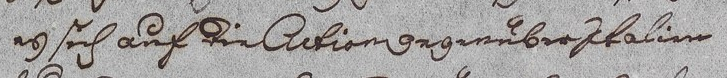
es sich auf die Action gegenüber Italien
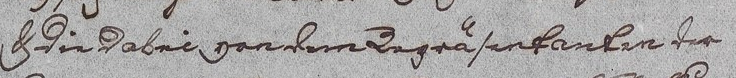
& die dabei von dem Repräsentanten der
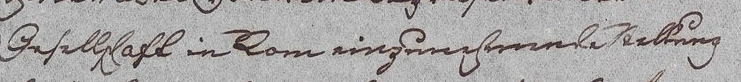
Gesellschaft in Rom einzunehmende Stellung
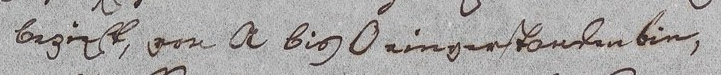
bezieht, von A bis O einverstanden bin,
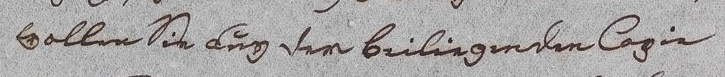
wollen Sie aus der beiliegenden Copie
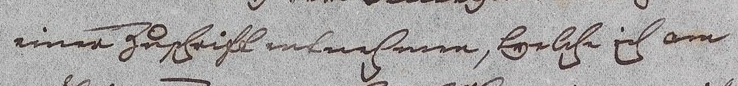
einer Zuschrift entnehmen, welche ich am
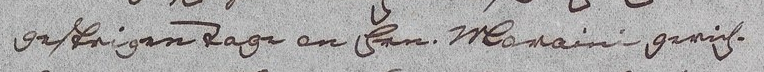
gestrigen Tage an Hrn. Maraini gerich-
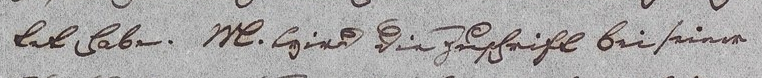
tet habe. M. wird die Zuschrift bei seiner
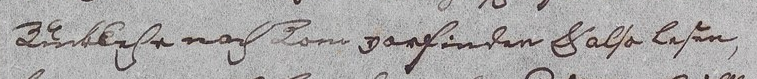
Rückkehr nach Rom vorfinden & also lesen,
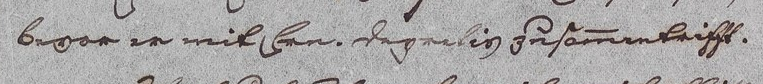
bevor er mit Hrn. Depretis zusammentrifft.
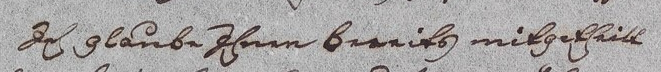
Ich glaube Ihnen bereits mitgetheilt
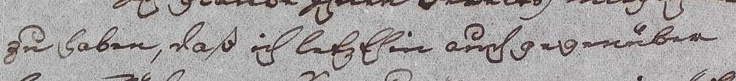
zu haben, daß ich letzthin auch gegenüber
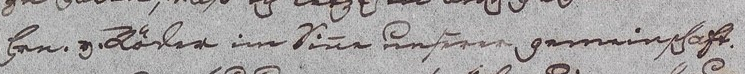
Hrn. v. Röder im Sinne unserer gemeinschaft-
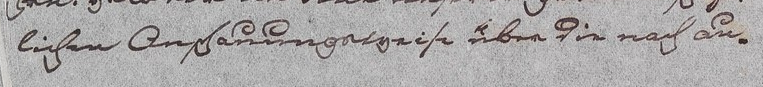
lichen Anschauungsweise über die nach au-
